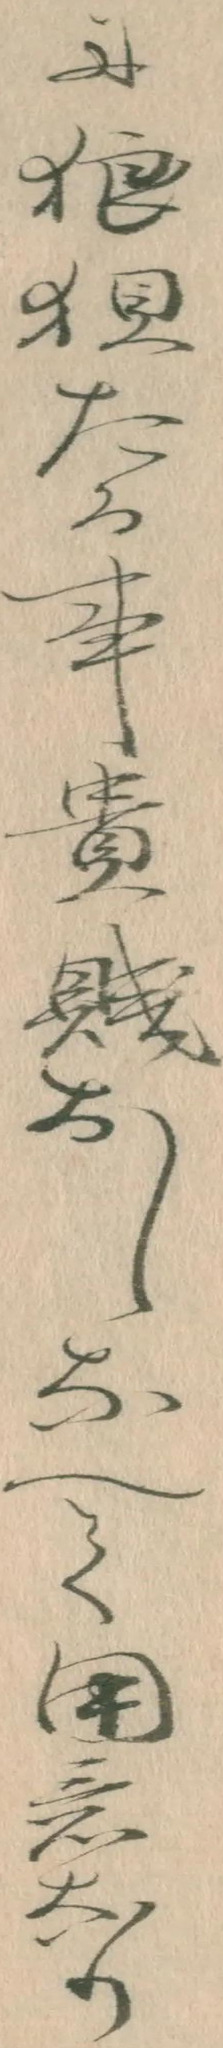に狼狽たる事貴賎おしなへて困意なり
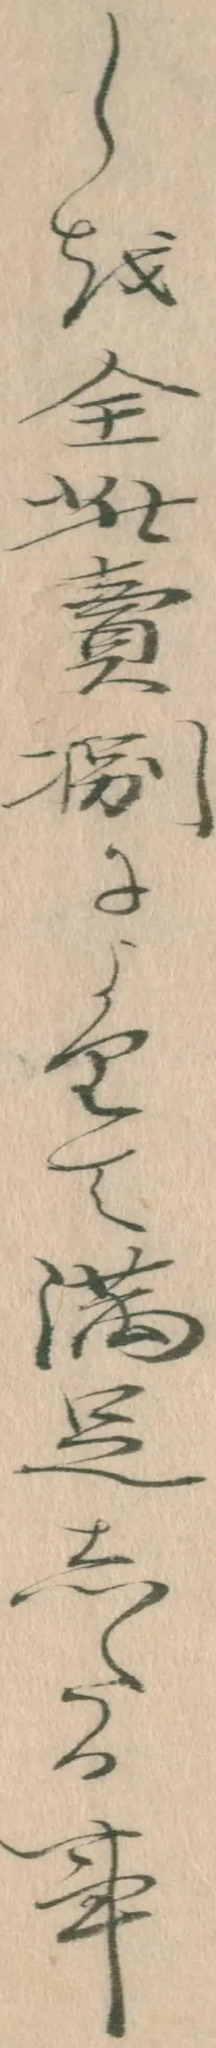しを全此売捌によりて満足したる事
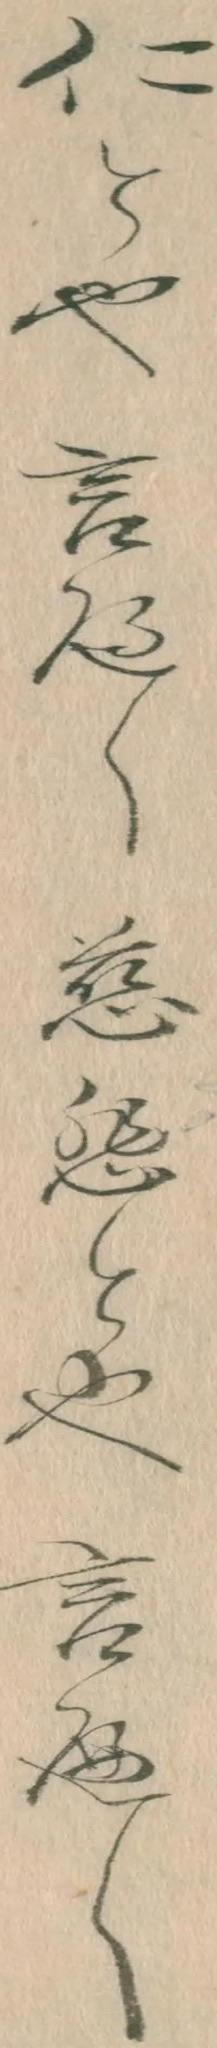仁とや言へし慈悲とや言へし
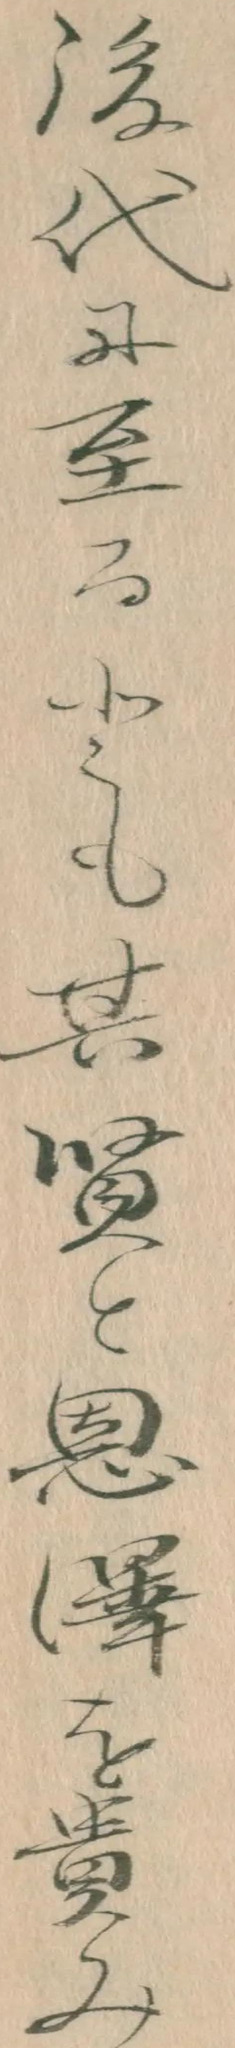後代に至とも其賢と恩沢を貴み
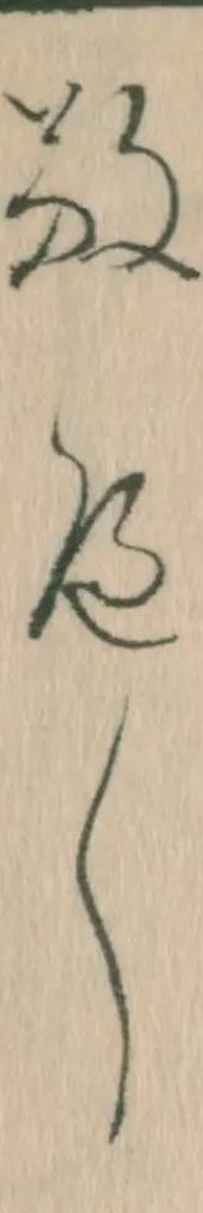敬へし
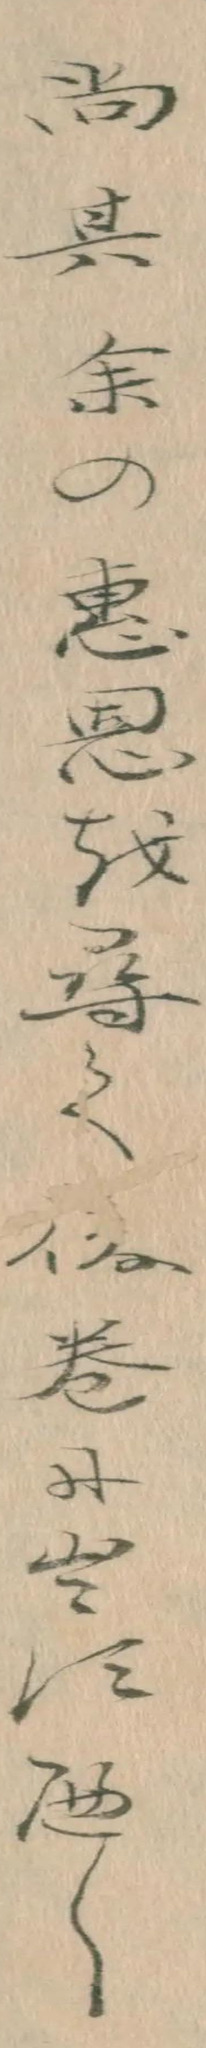尚其余の恵恩を尋て後巻に出すへし
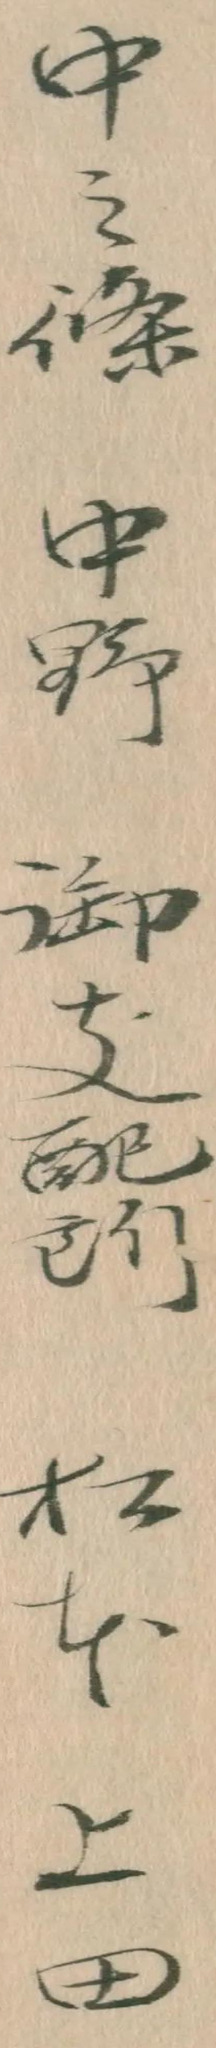中之條中野御支配所松本上田
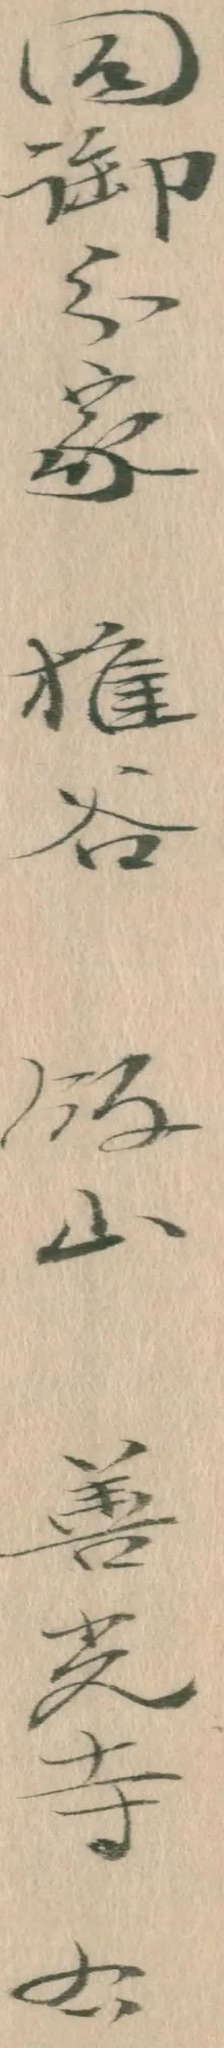同御分家椎谷飯山善光寺右
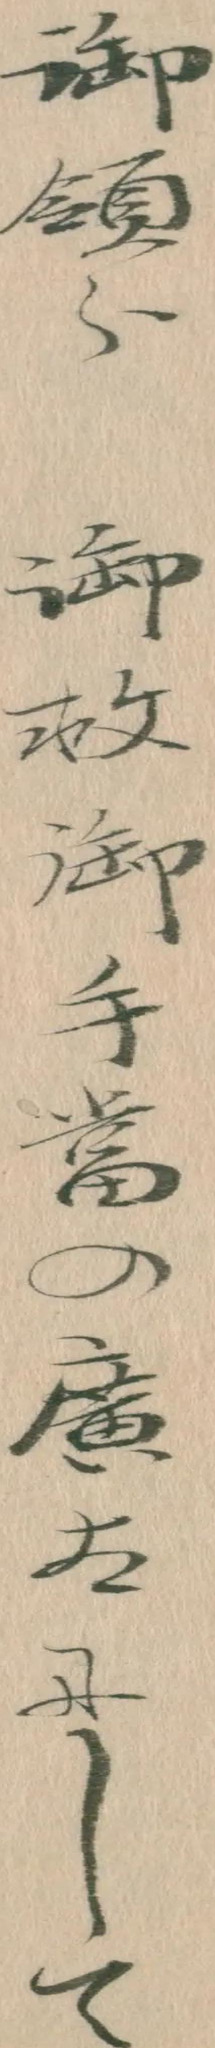御領分御救御手当の広太にして
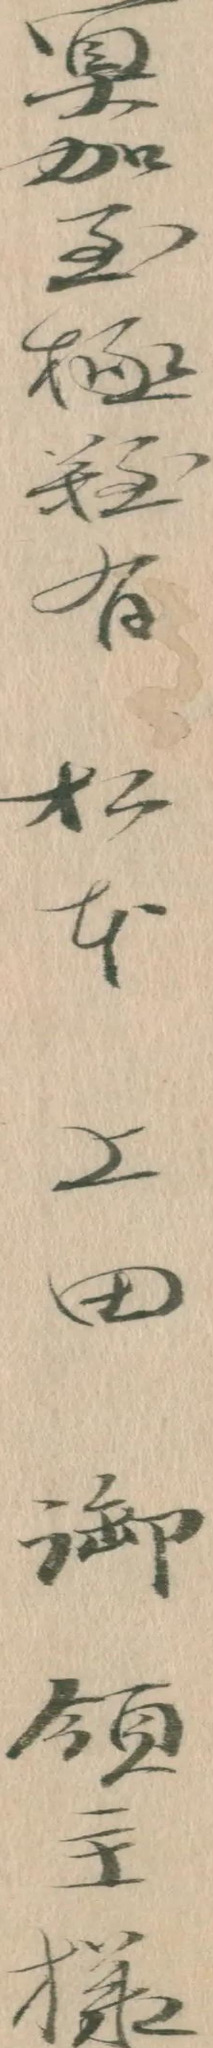冥加至極難有松本上田御領主様
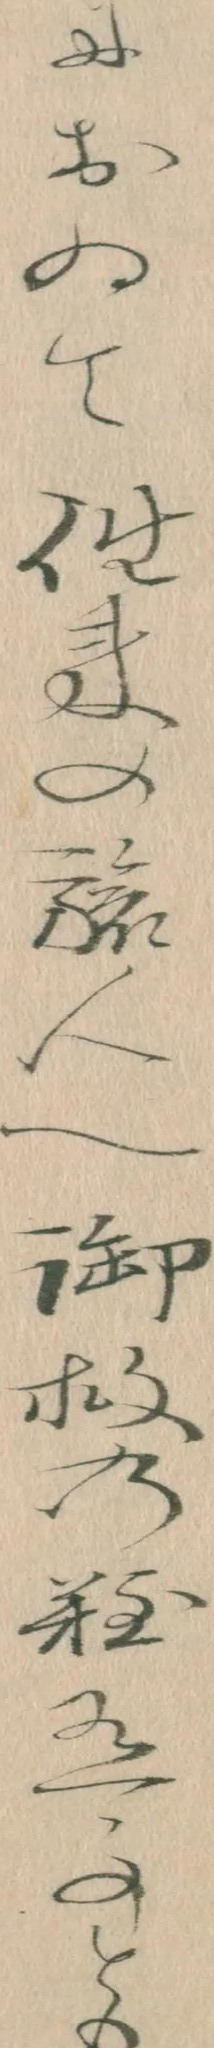におゐて往来の旅人へ御救の難有事とも
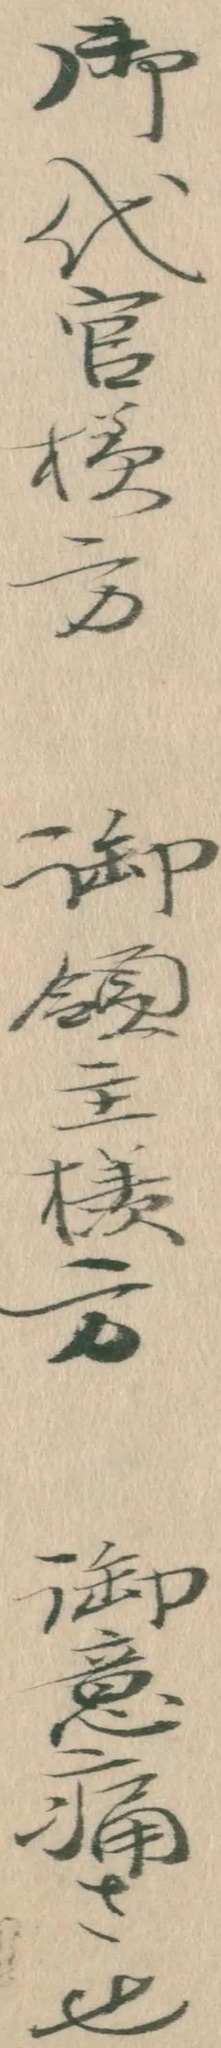御代官様方御領主様方御意痛させ
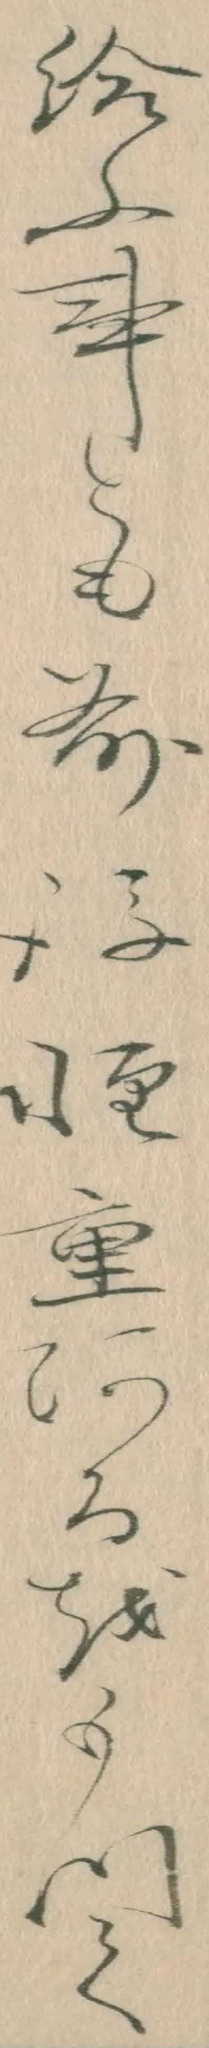給ふ事とも前後軽重あるをもつて
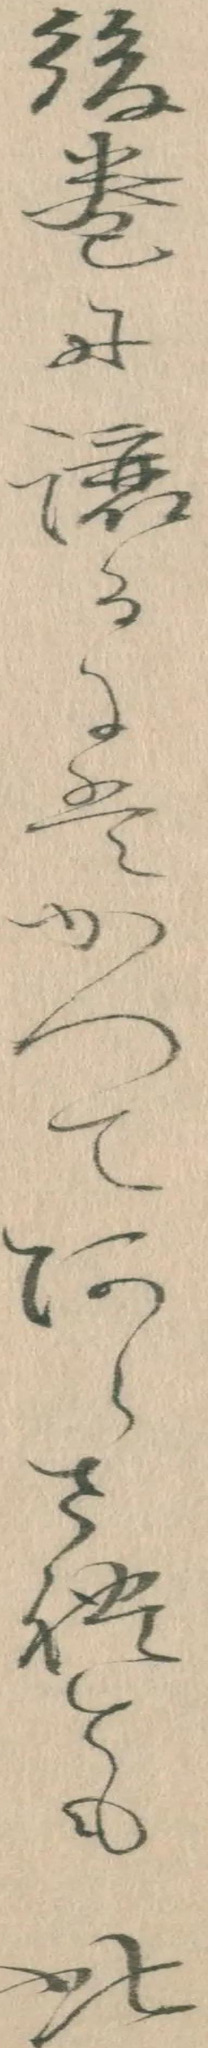後巻に譲るにはかつてあらされとも此
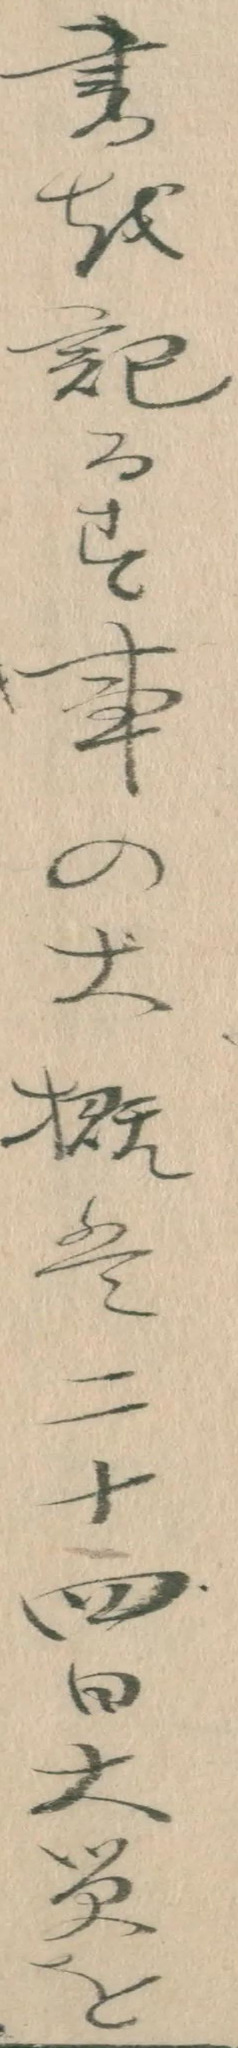書を記るす事の大概は二十四日大災を

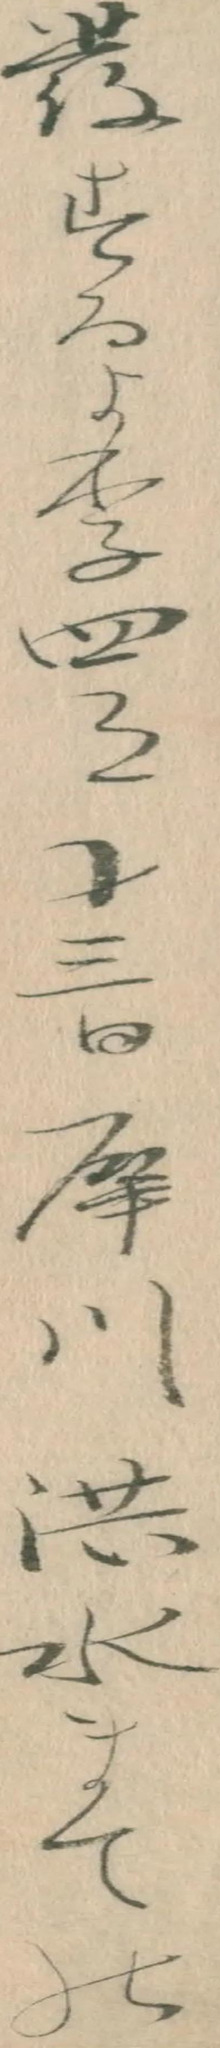発するより四月十三日犀川洪水まての
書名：俗語之種. [6]
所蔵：国立国会図書館 National Diet Library, JAPAN
